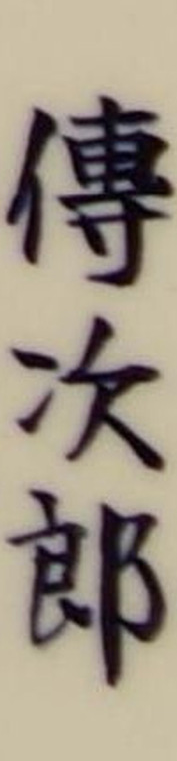傳次郎
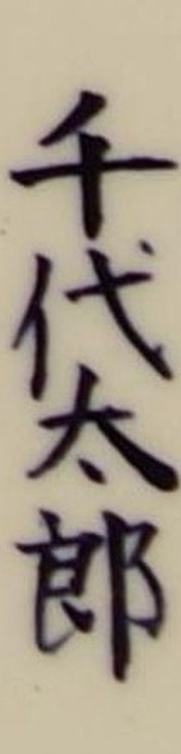千代太郎
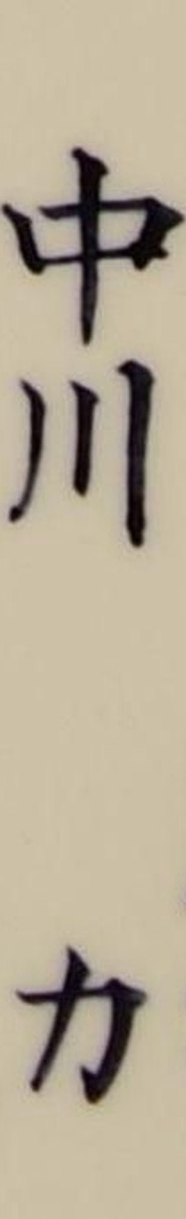中川力
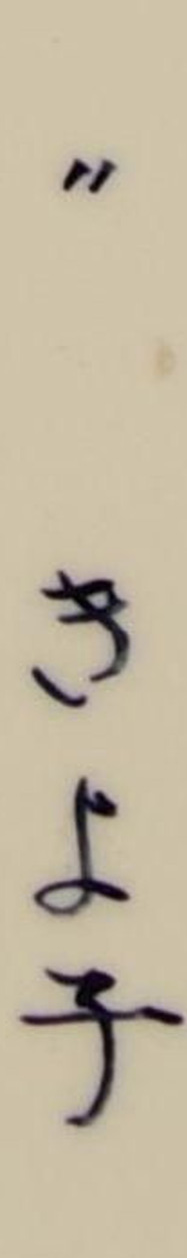きよ子
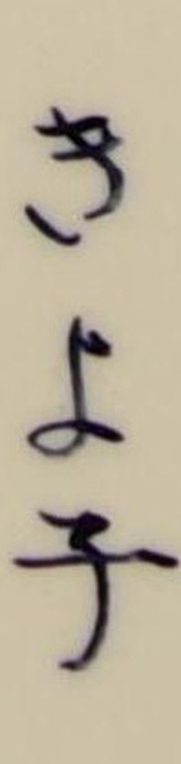きよ子
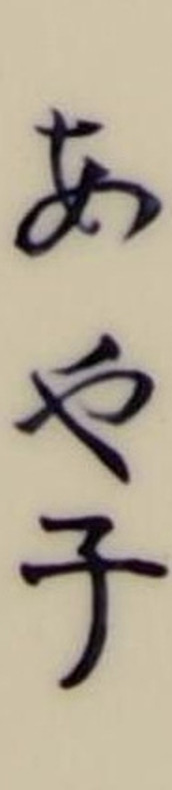あや子
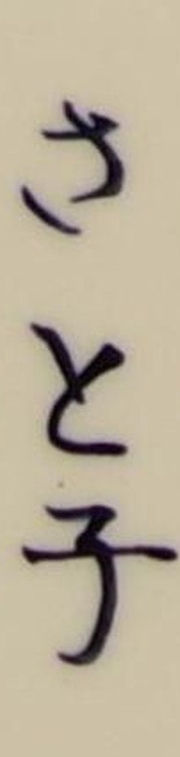さと子
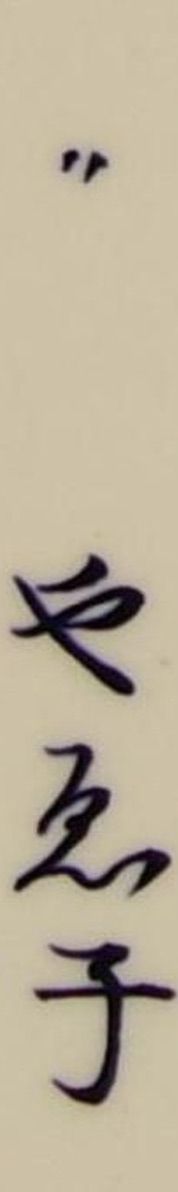やゑ子
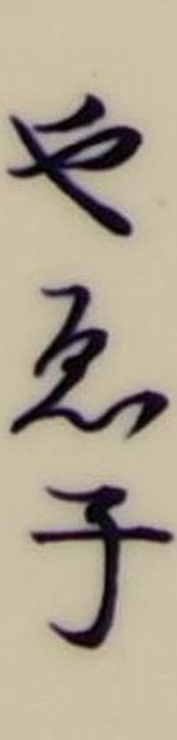やゑ子
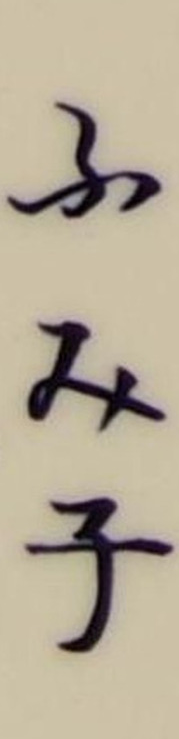ふみ子
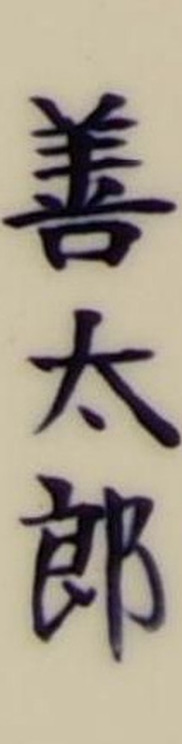善太郎
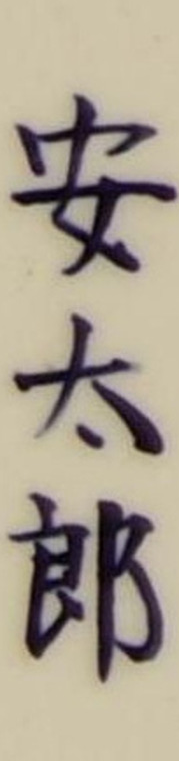安太郎
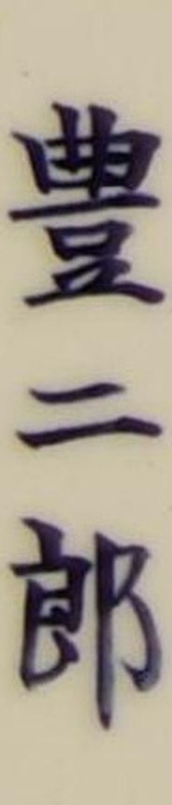豊二郎

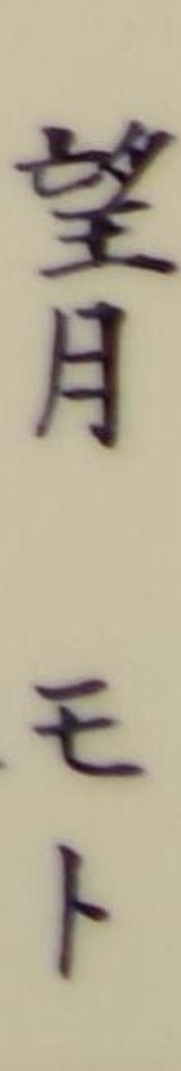望月モト
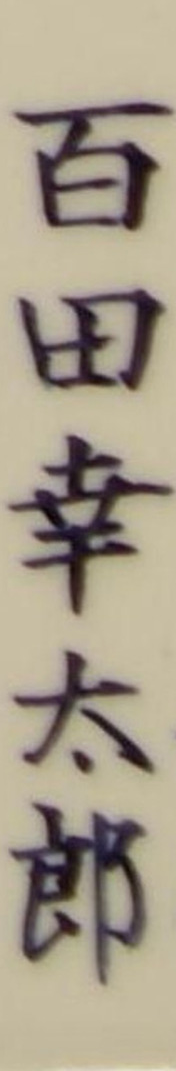百田幸太郎
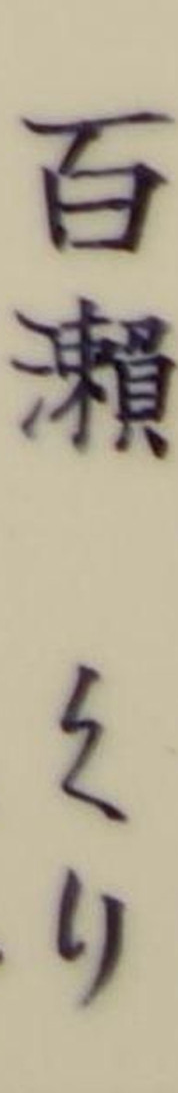百瀬くリ
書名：A~D
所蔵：koyasan kongobuji
